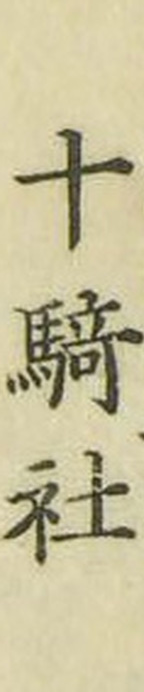十騎社
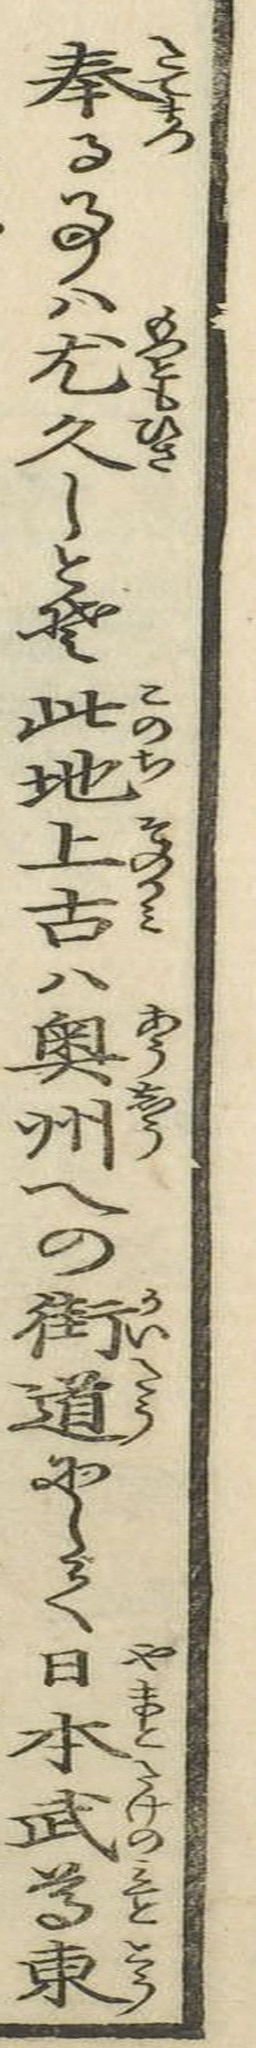奉る事は尤久しとそ此地上古は奥州への街道にして日本武尊東
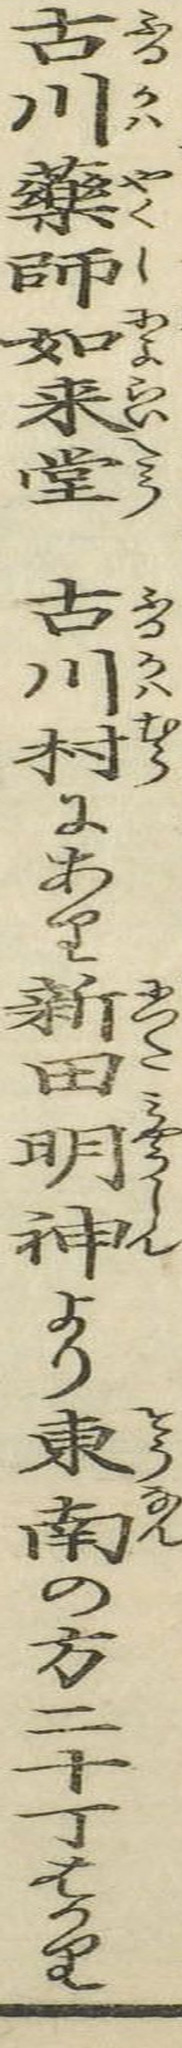古川藥師如来堂古川村にあり新田明神より東南の方二十丁はかり
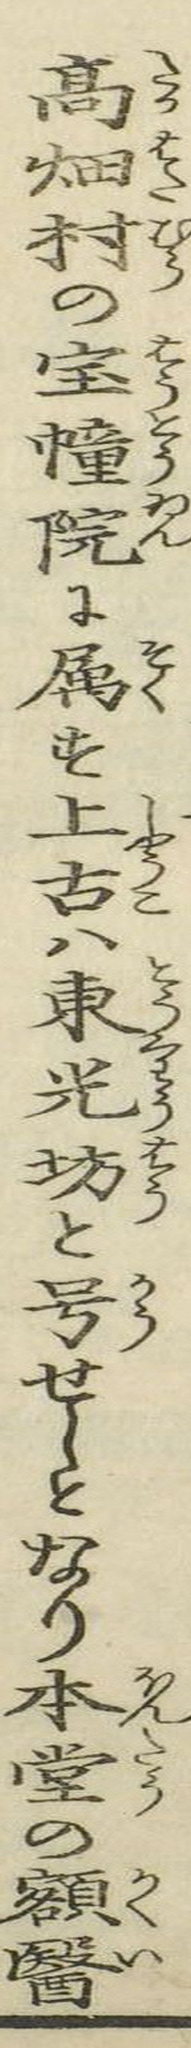髙畑村の宝幢院に属す上古は東光坊と号せしとなり本堂の額醫
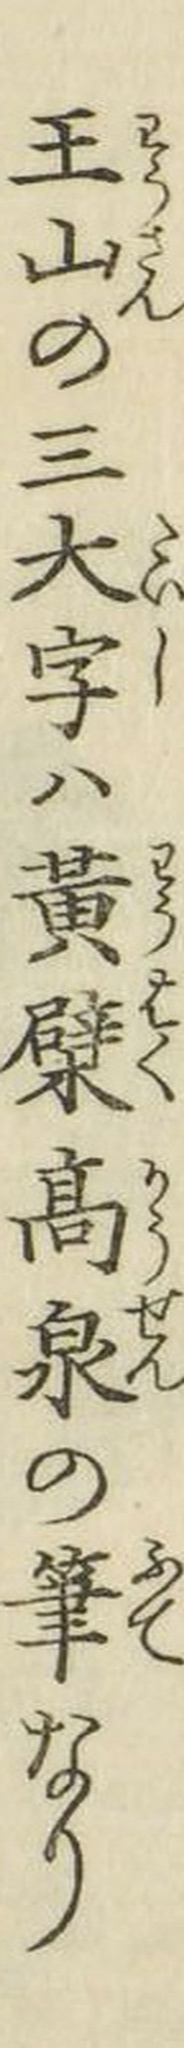王山の三大字は黄檗髙泉の筆なり
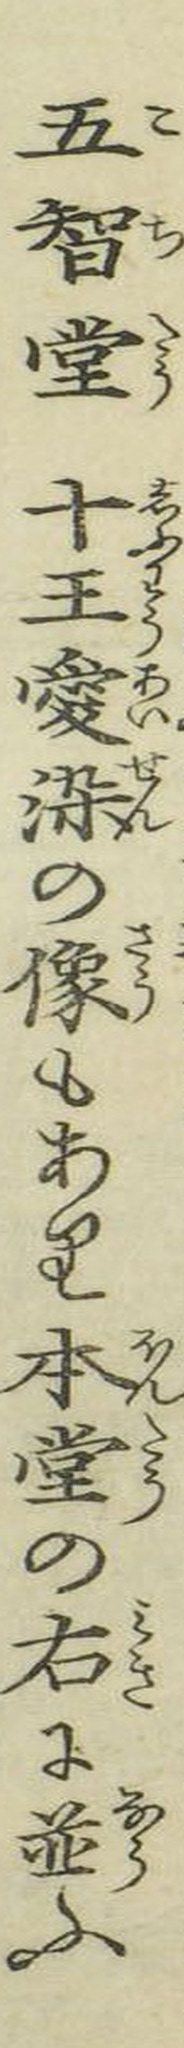五智堂十王愛染の像もあり本堂の右に並ふ

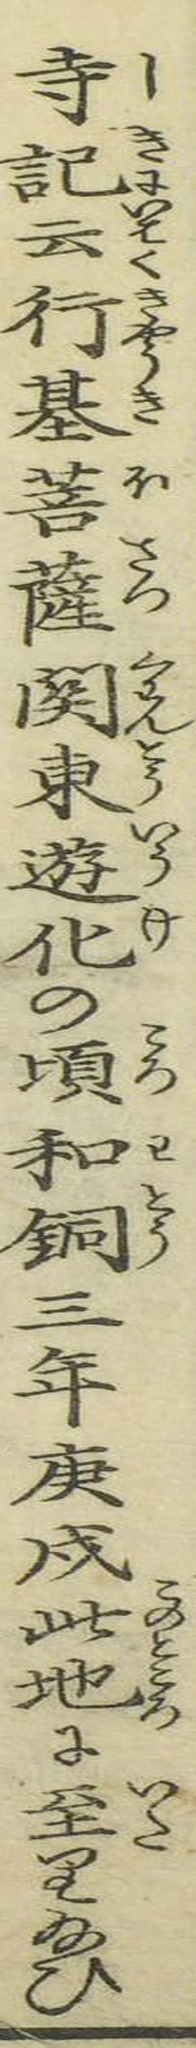寺記云行基菩薩關東遊化の頃和銅三年庚戌此地に至り給ひ
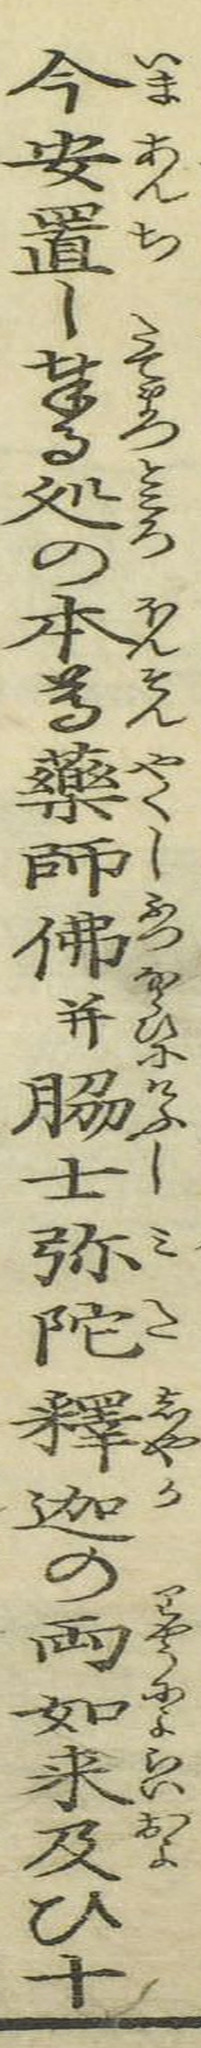今安置し奉る処の本尊藥師佛幷脇士弥陀釋迦の両如来及ひ十
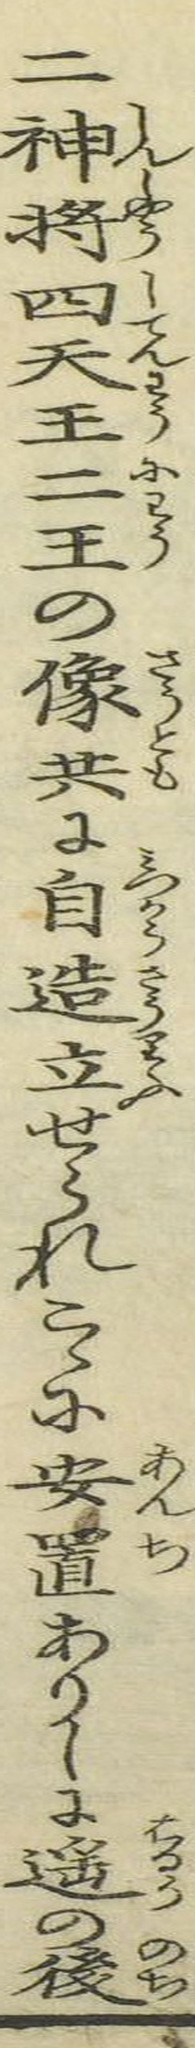二神將四天王二王の像共に自造立せられこゝに安置ありしに遥の後
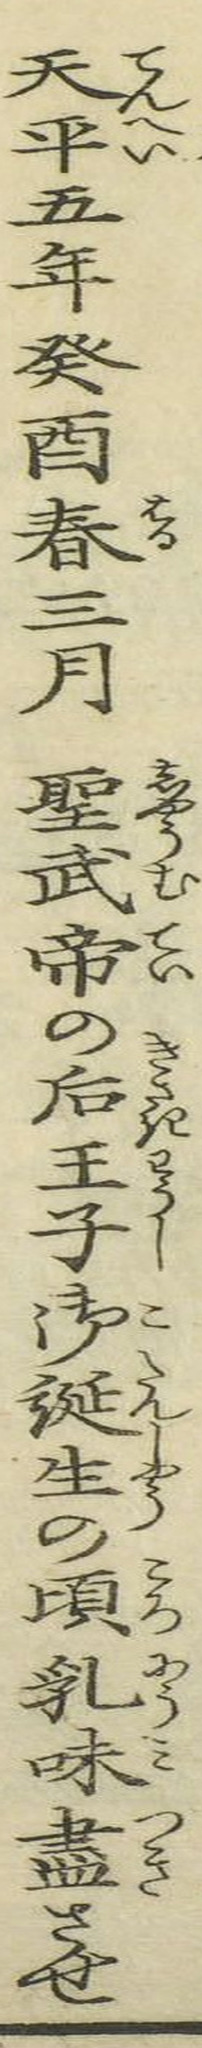天平五年癸酉春三月聖武帝の妃王子御誕生の頃乳味盡させ
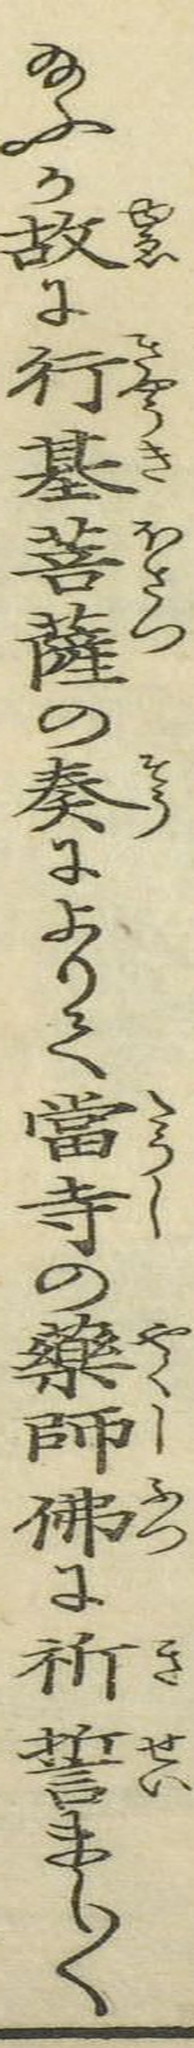給ふか故に行基菩薩の奏によりて當寺の藥師佛に祈誓まし〳〵
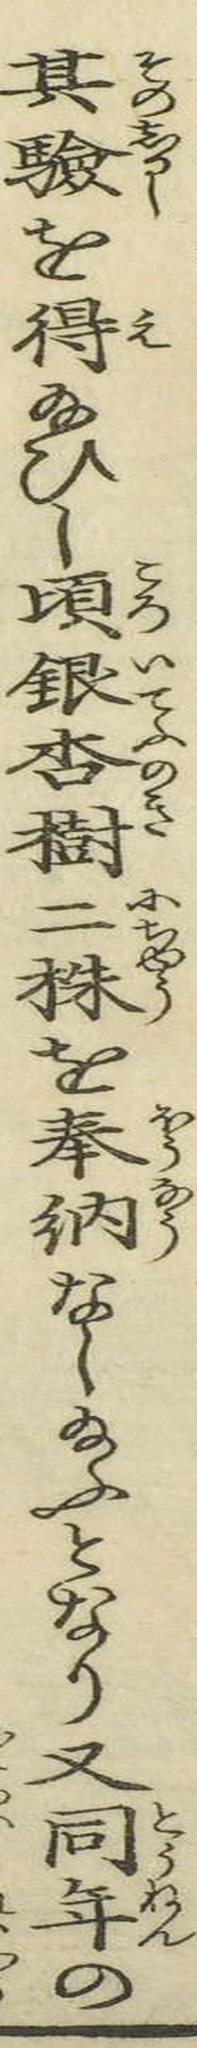其驗を得給ひし頃銀杏樹二株を奉納なし給ふとなり又同年の
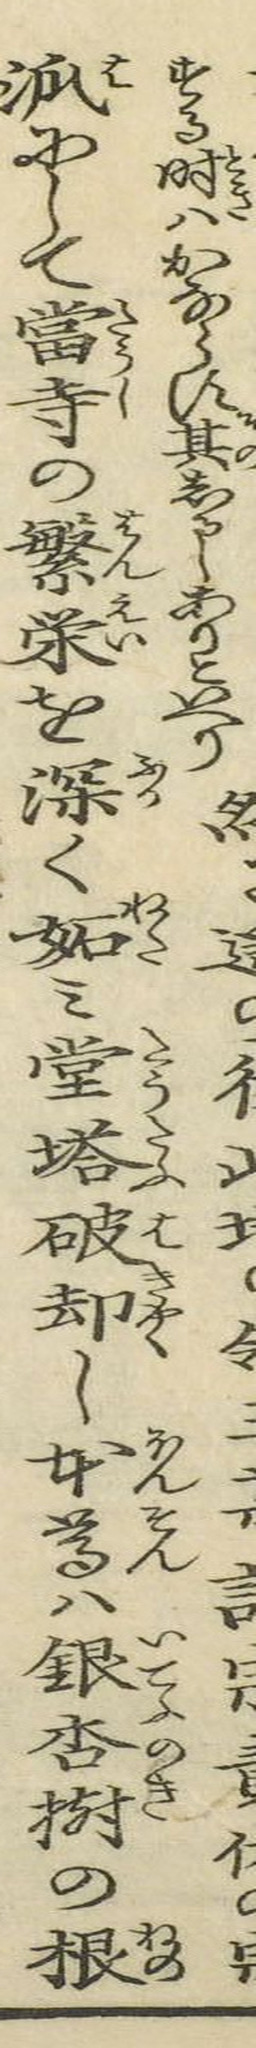派にして當寺の繁栄を深く妬み堂塔破却し本尊は銀杏樹の根
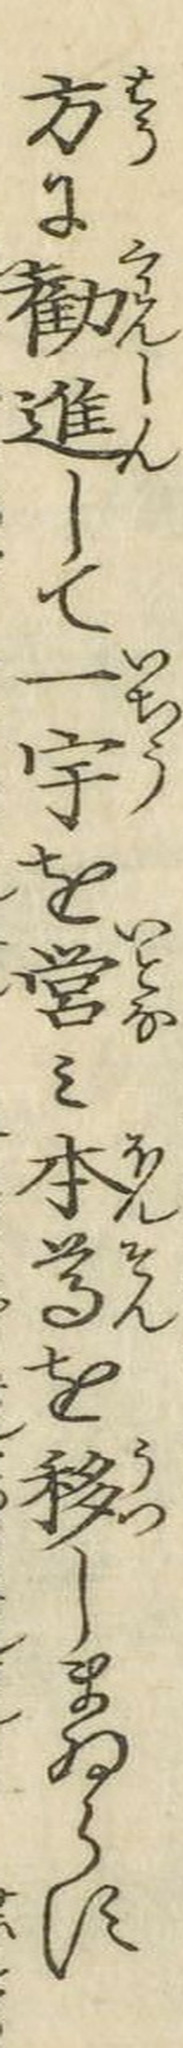方に勧進して一宇を営み本尊を移しまゐらす
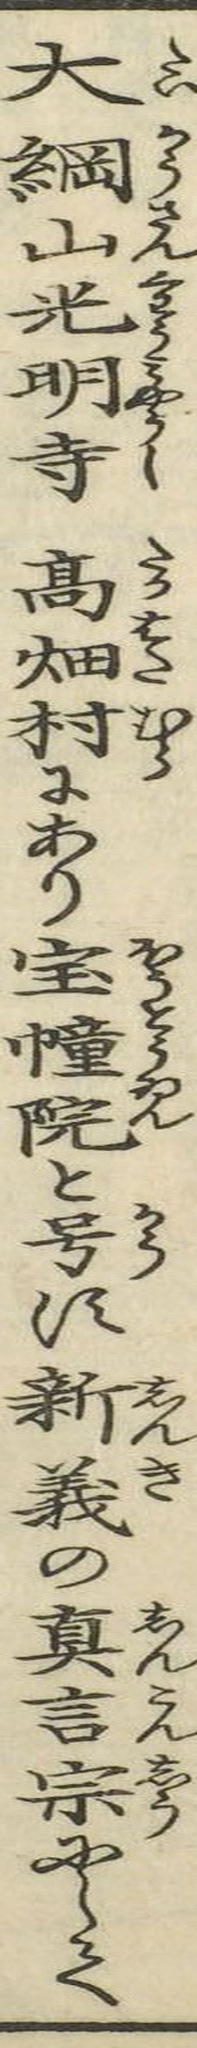大綱山光明寺髙畑村にあり宝幢院と号す新義の真言宗にして
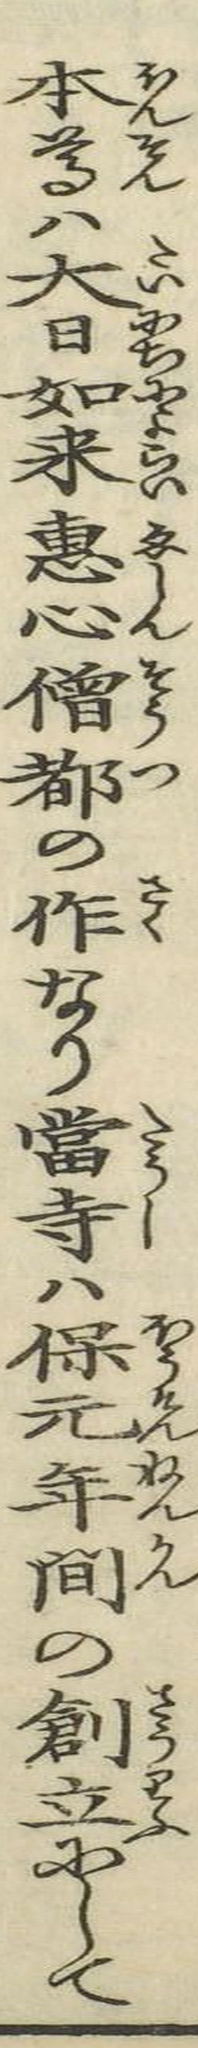本尊は大日如来惠心僧都の作なり當寺は保元年間の創立にして
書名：江戸名所図会 20巻 巻之4
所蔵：東京学芸大学教育コンテンツアーカイブ
